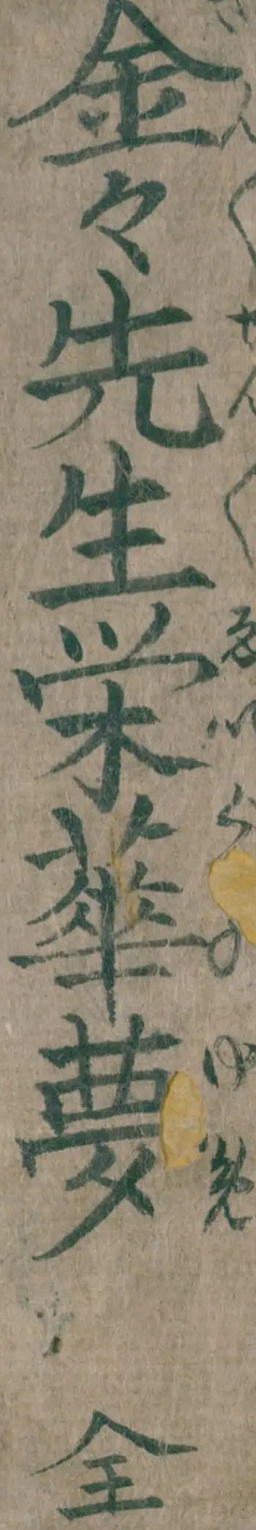金々先生栄華夢全

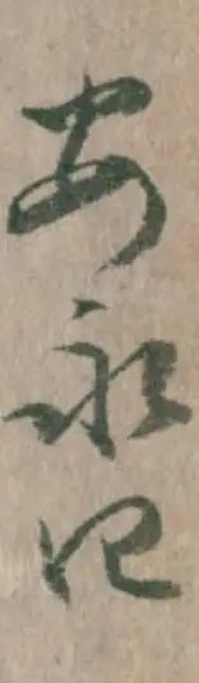安永四
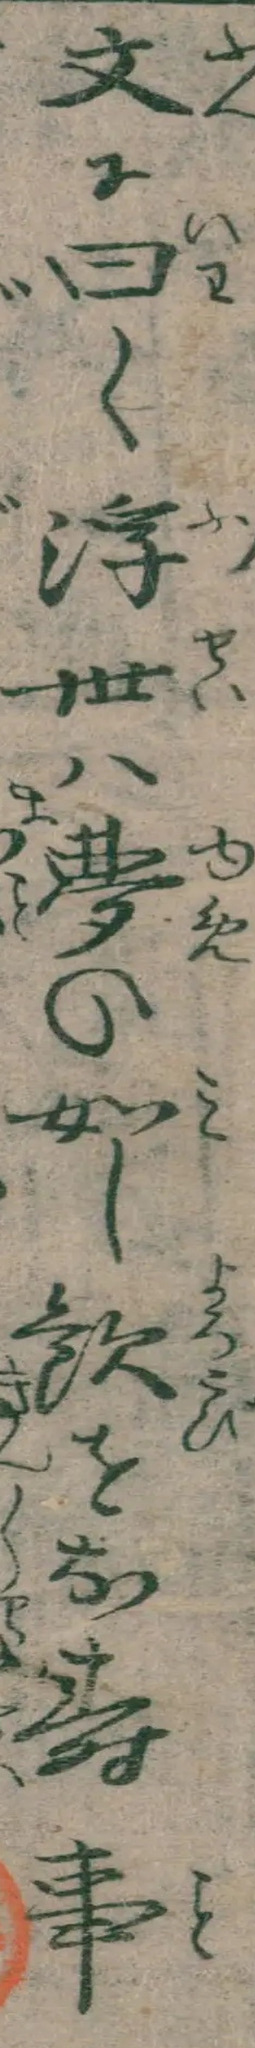文に曰く浮世は夢の如し歓をなす事
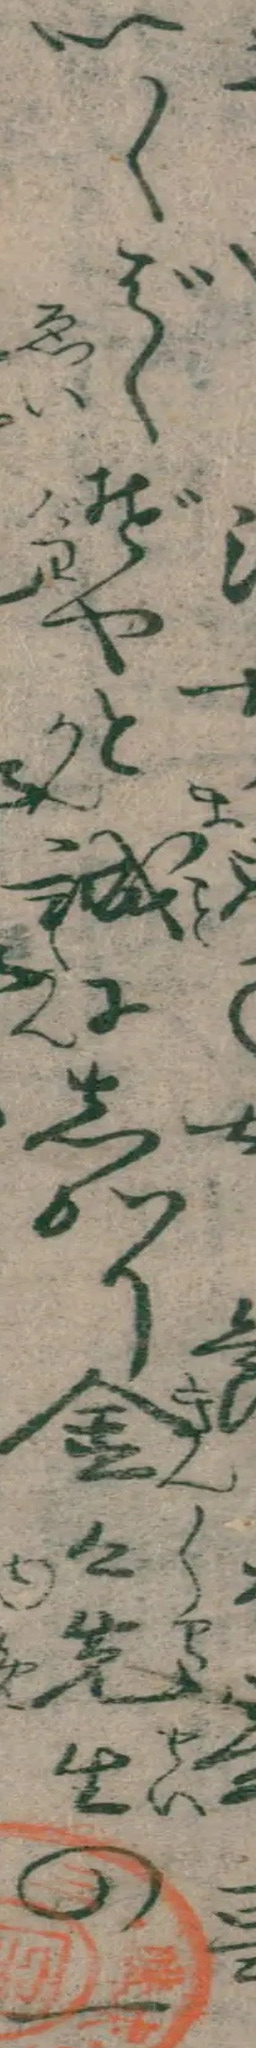いくばくぞやと誠にしかり金々先生の一
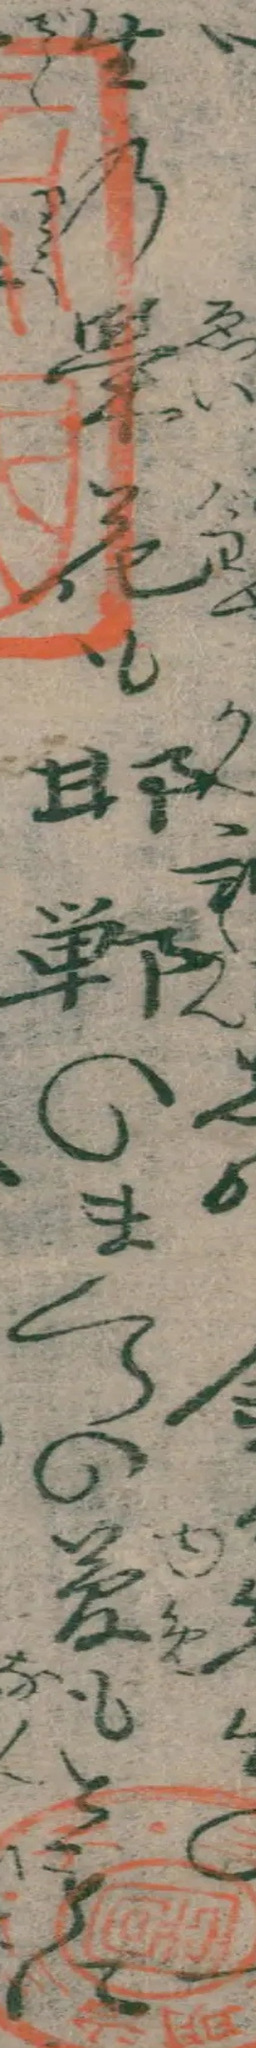生の栄花も邯鄲のまくらの夢もともに
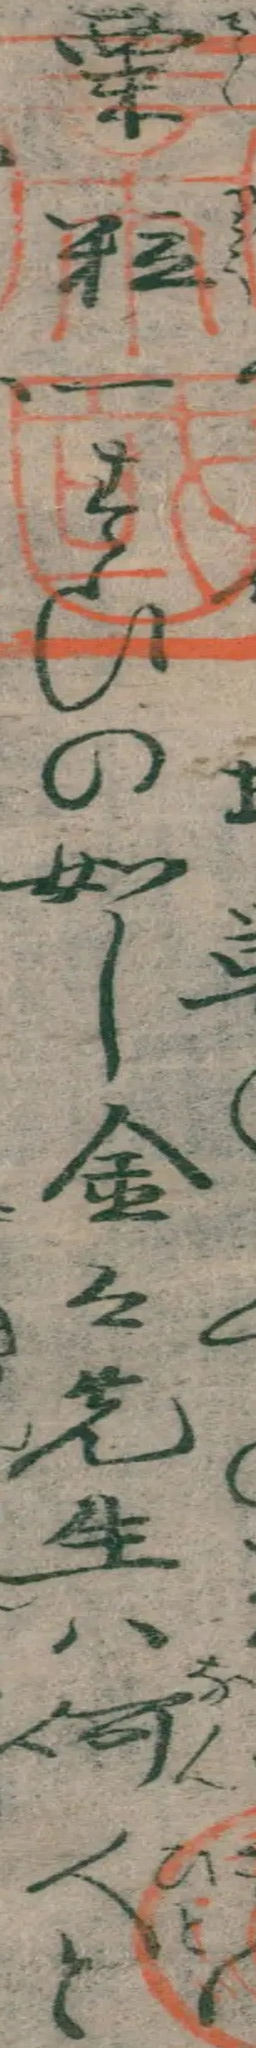粟粒一すひの如し金々先生は何人と
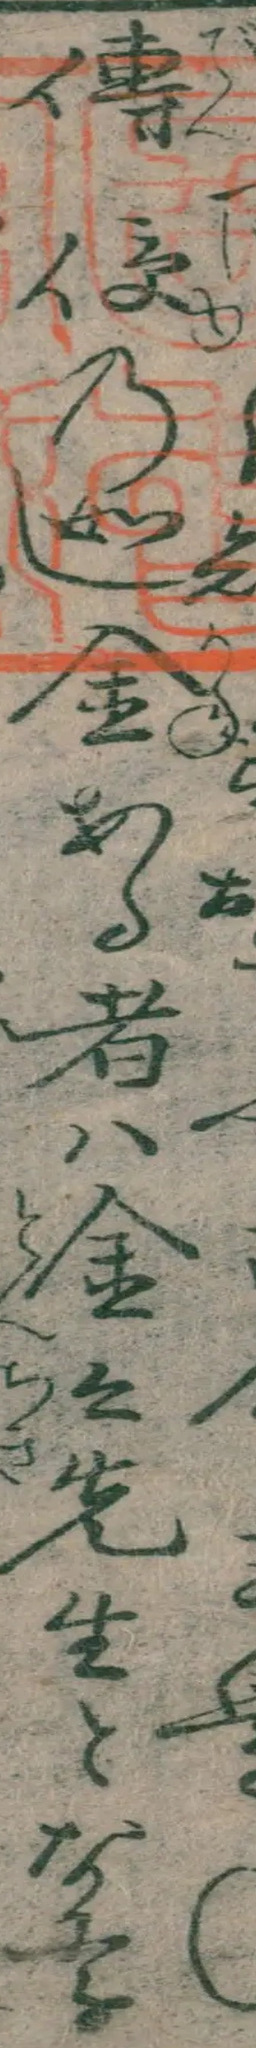伝授の如し金ある者は金々先生となり
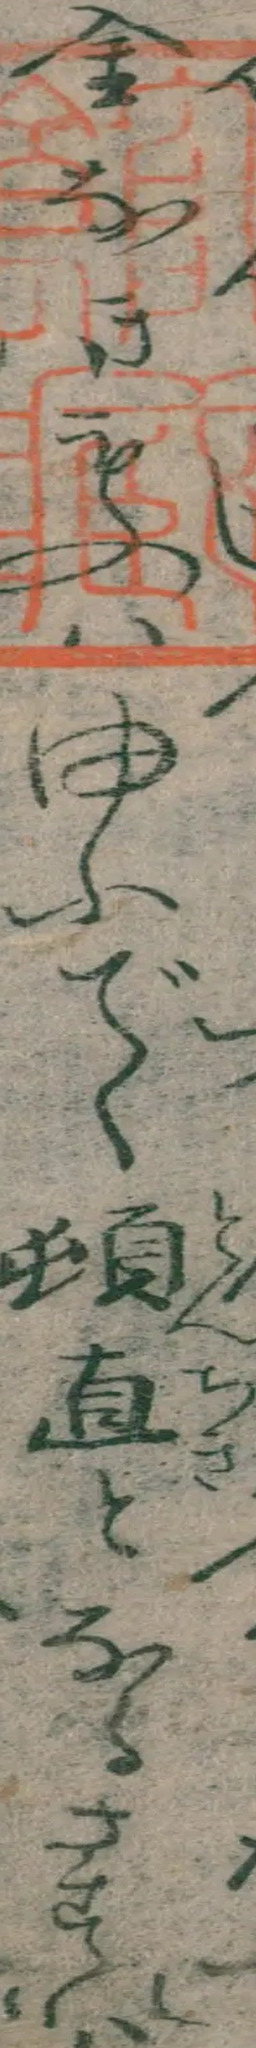金なきものはゆふでゝ頓直となるさすれは
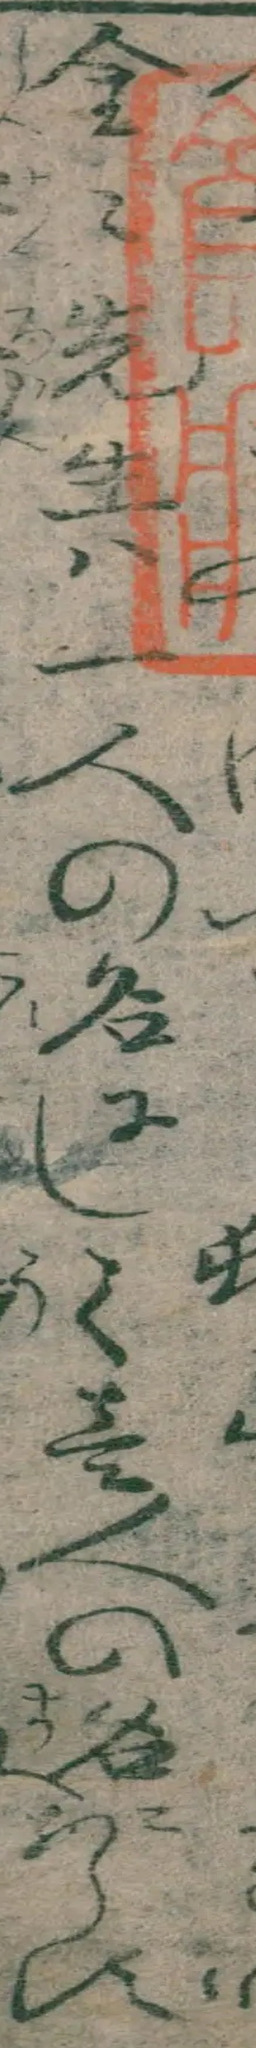金々先生は一人の名にして壱人の名にあらす
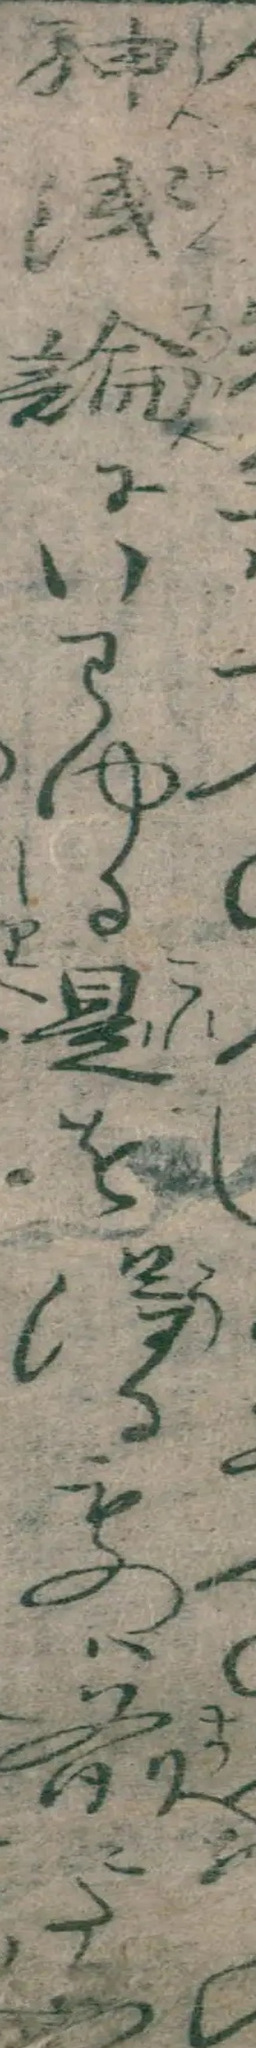神浅論にいわゆる是を得るものは前にたち
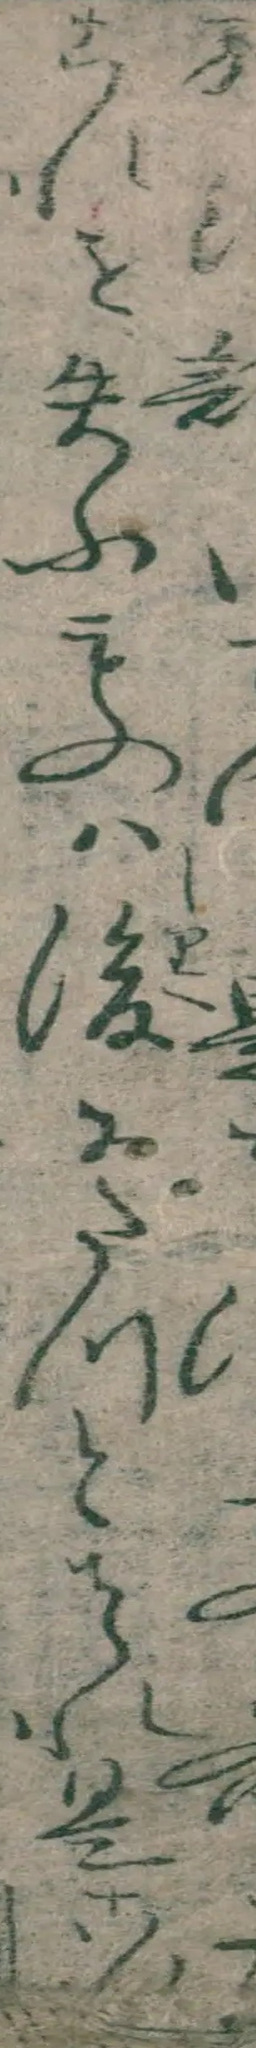これを失ふものは後にたつとそれ是これを
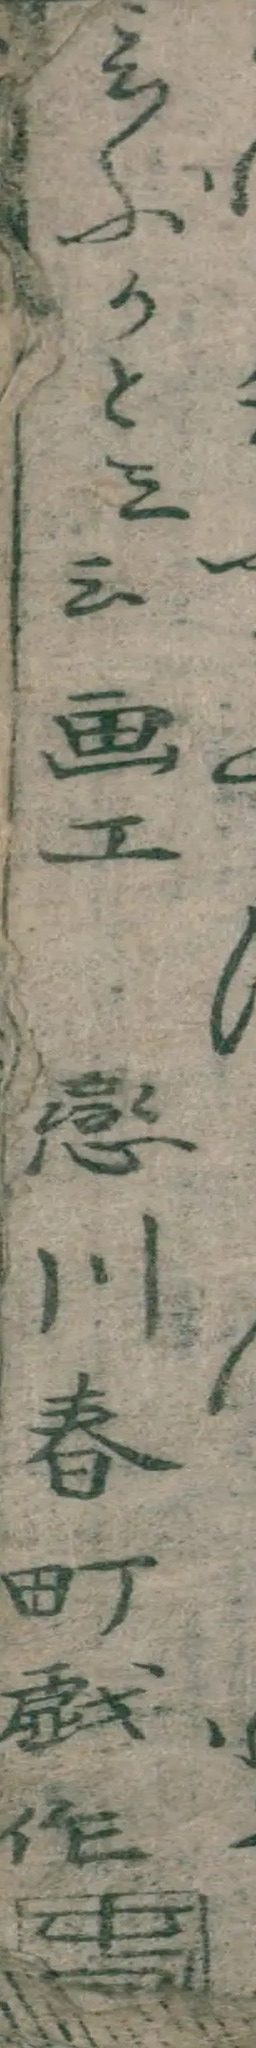言ふかと云々画工恋川春町戯作

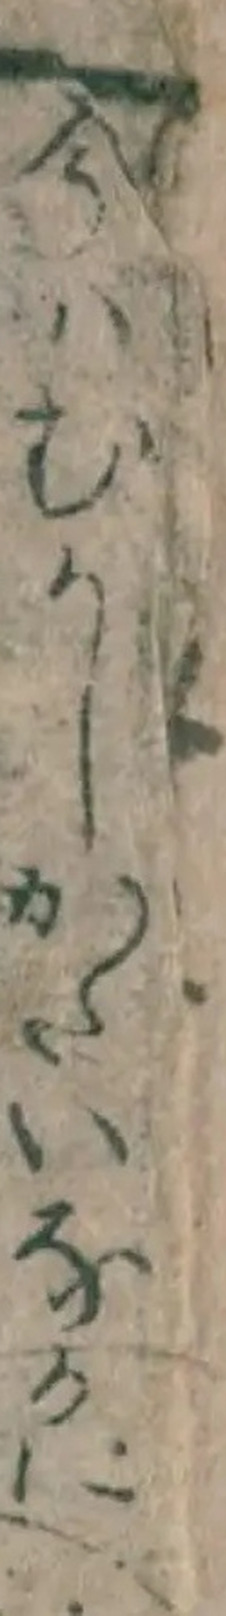今はむかしかたいなかに
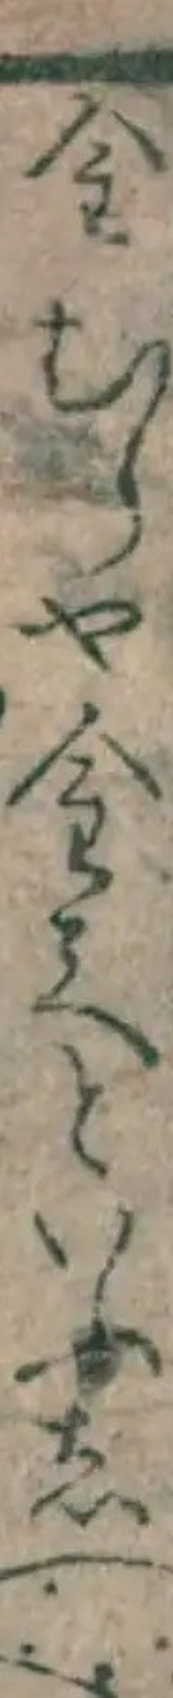金むらや金兵へといふ志
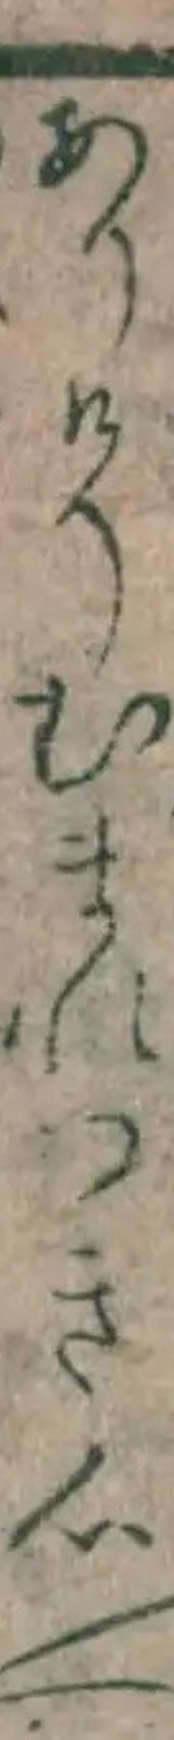ありけりむまれつき心
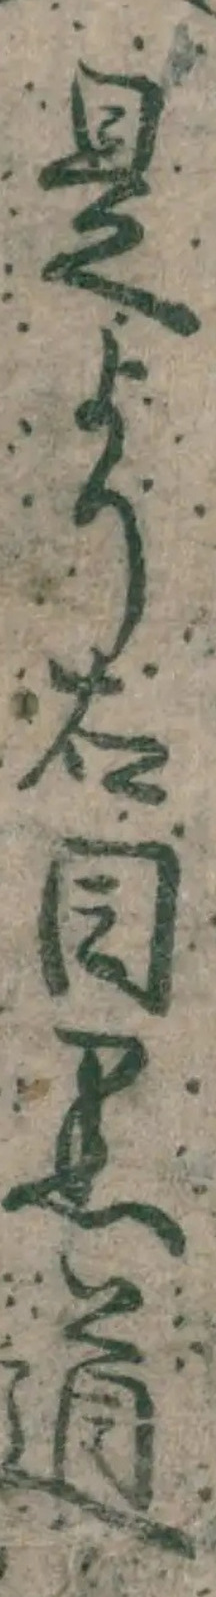是より右目黒道
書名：金々先生栄花夢 : 2巻
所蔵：国立国会図書館 National Diet Library, JAPAN
